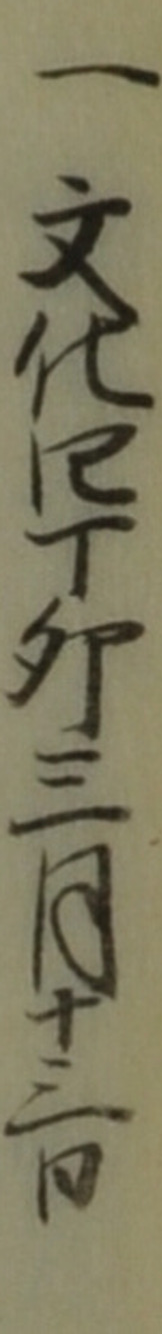一文化四丁卯三月十三日
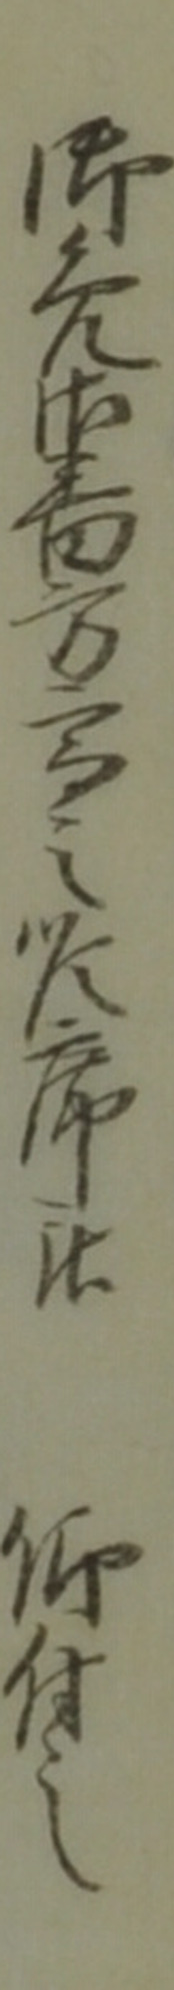御免御番方高之順席被仰付之
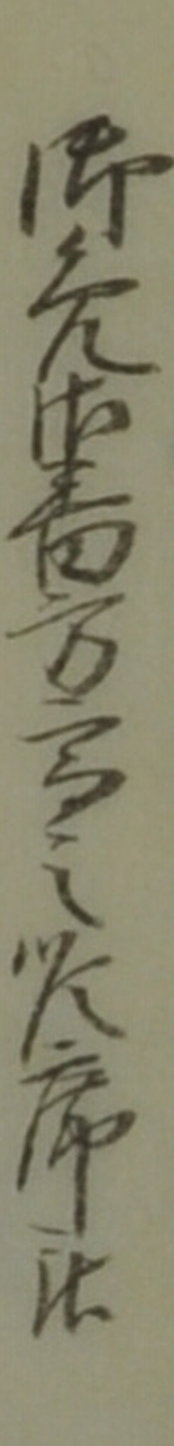勤御免御番方高之順席被
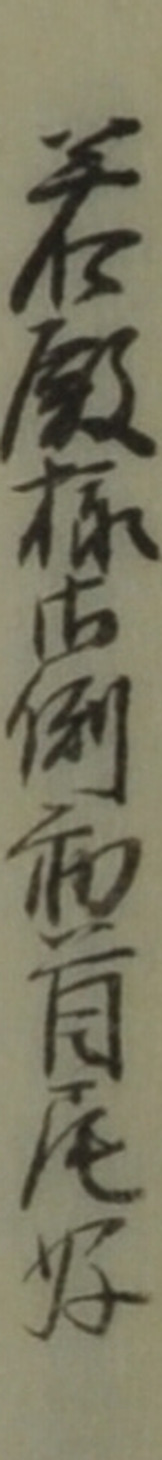若殿様御側勤首尾好
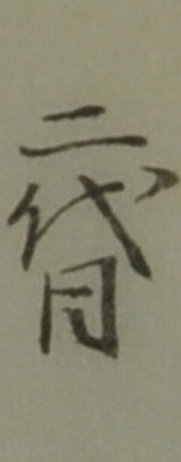二代目
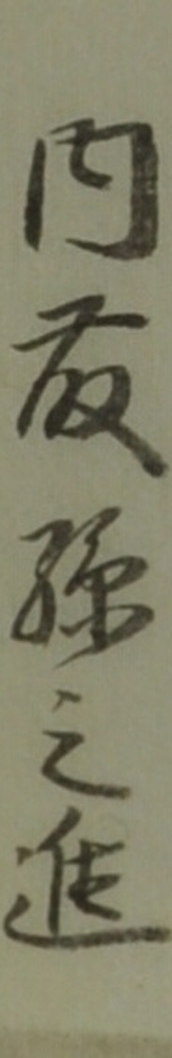内藤孫之進
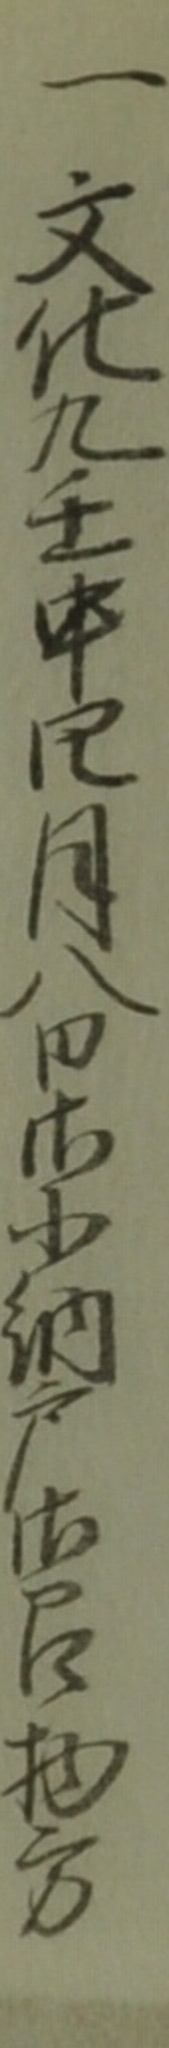一文化九壬申四月八日御小納戸御召物方
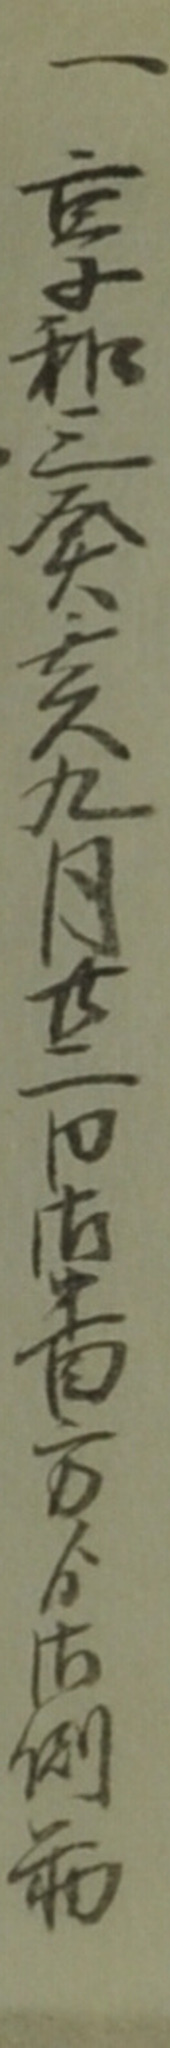一享和三癸亥九月廿二日御番方ゟ御側勤
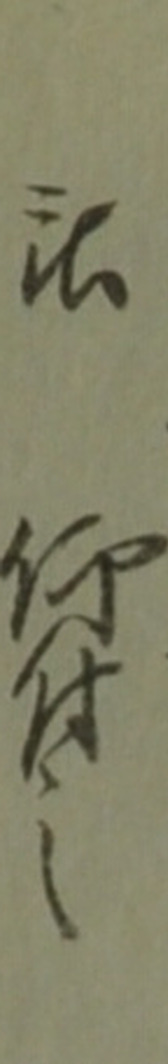被仰付之
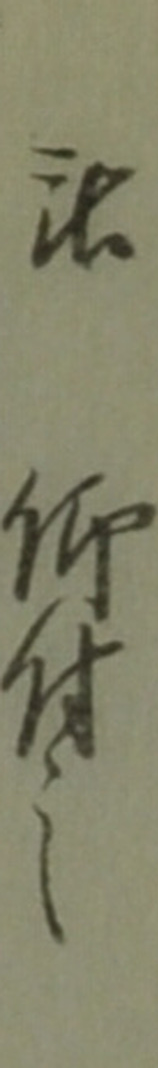被仰付之
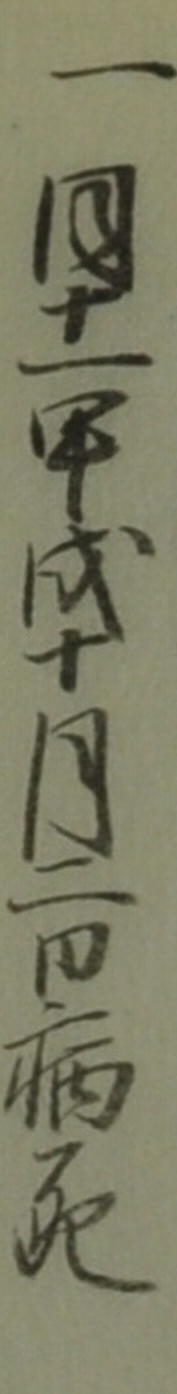一同十一甲戌十月二日病死
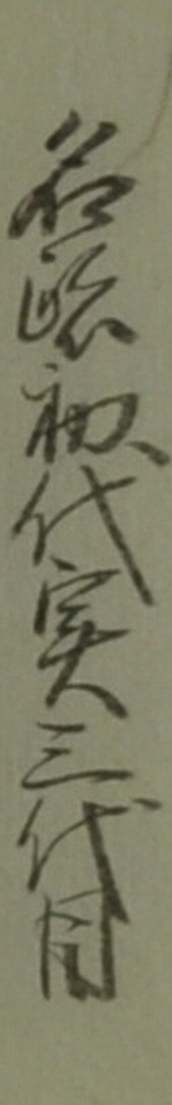名跡初代実三代目
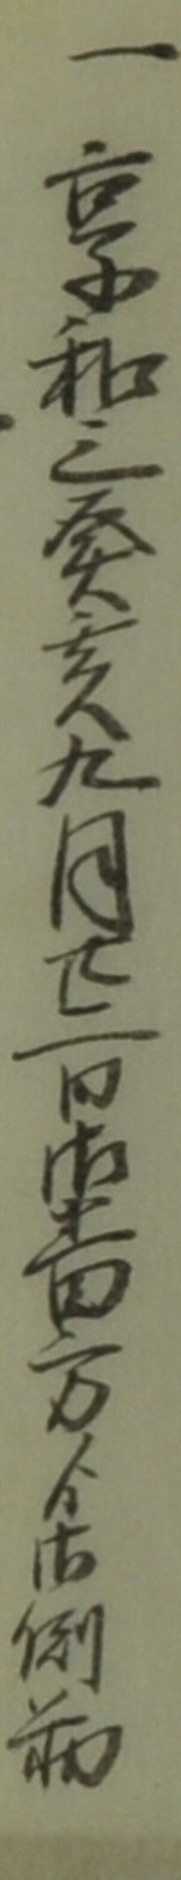一享和三癸亥九月廿二日御番方ゟ御側勤
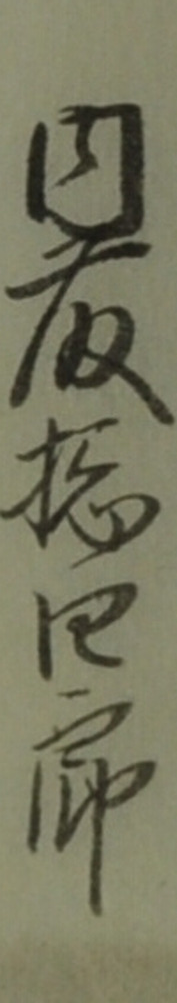内藤捴四郎
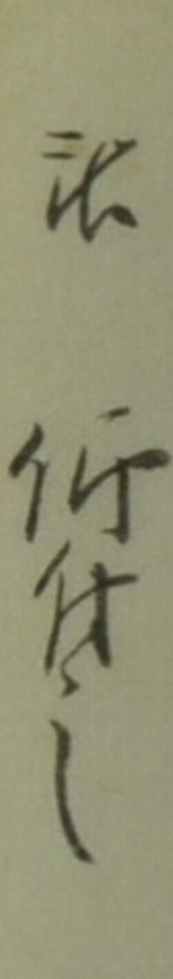被仰付之
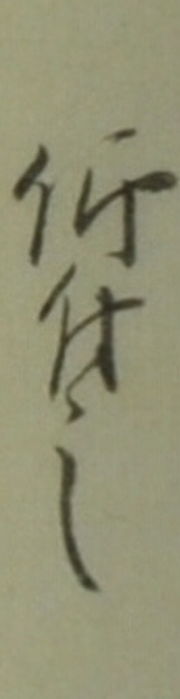仰付之
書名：諸御役代々録（五）
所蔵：伊那市立高遠町図書館・合同会社AMANE
